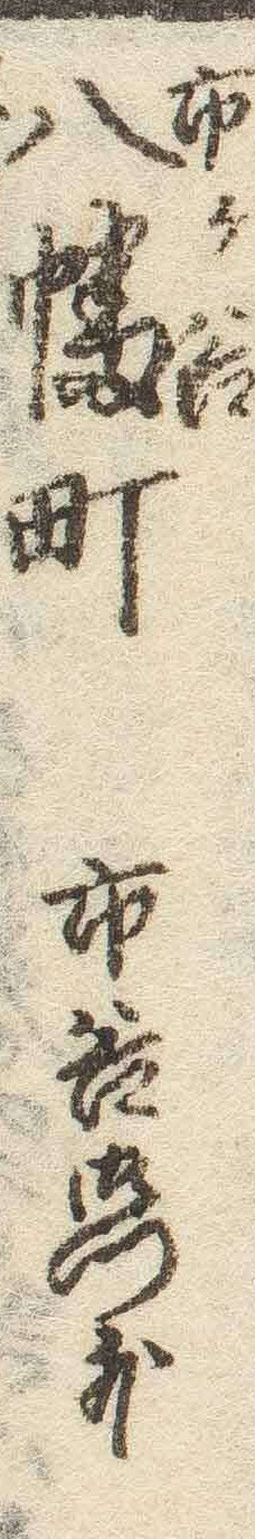八幡町市谷御門外
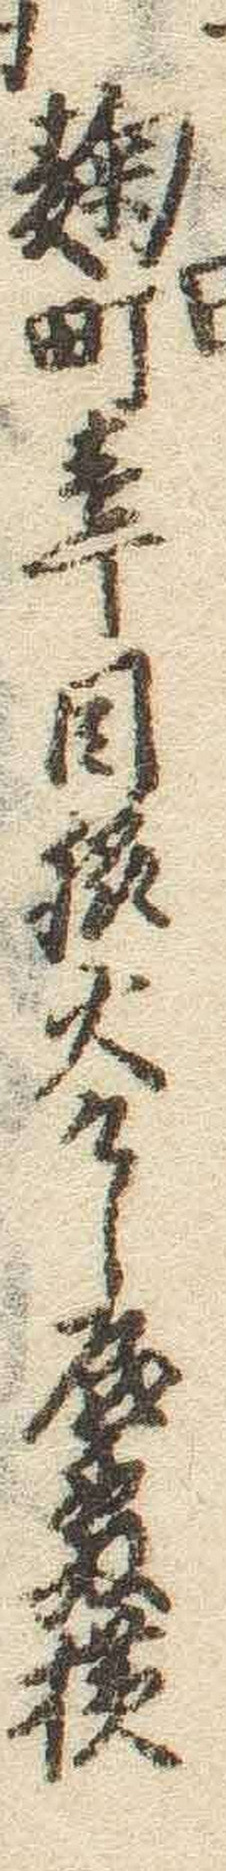麹町壱丁目脇火けし屋敷横
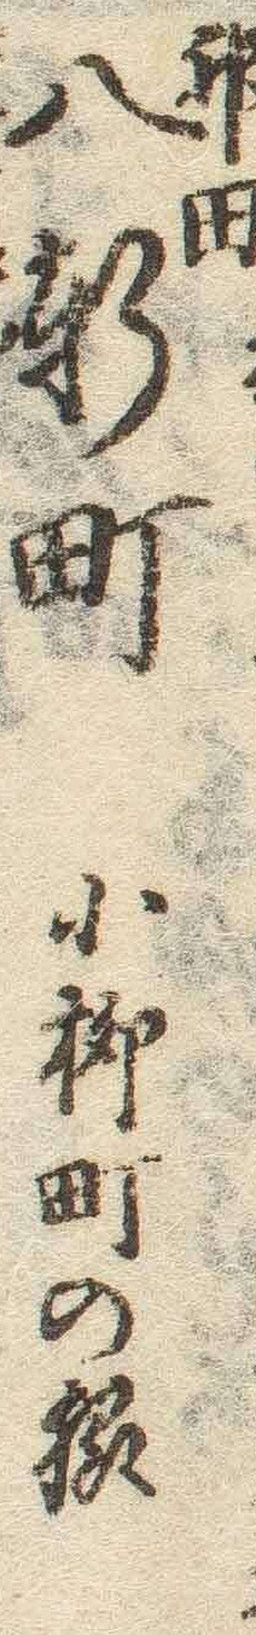八軒町小柳町の脇
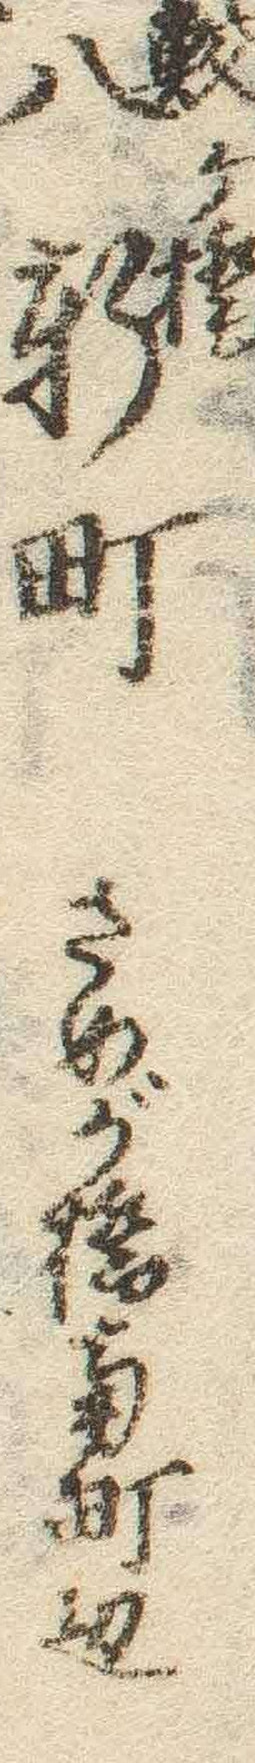八軒町さめが橋南町辺
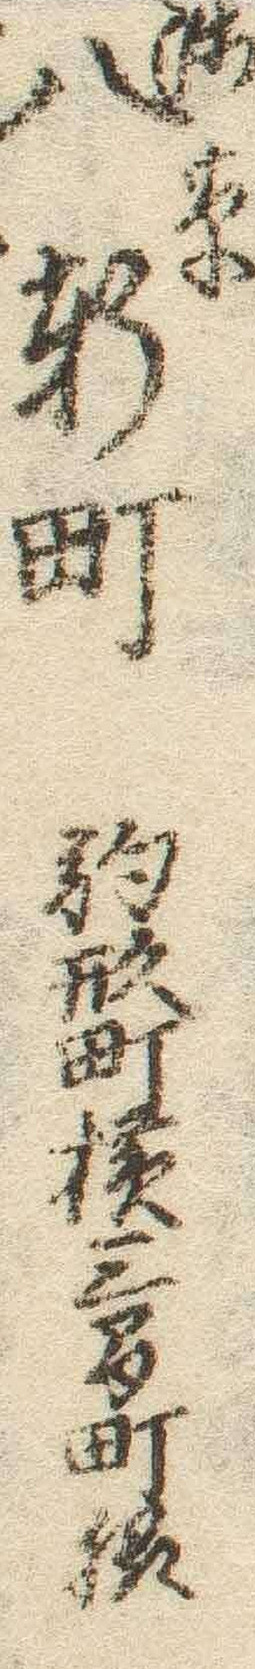八軒町駒形町横三間町脇
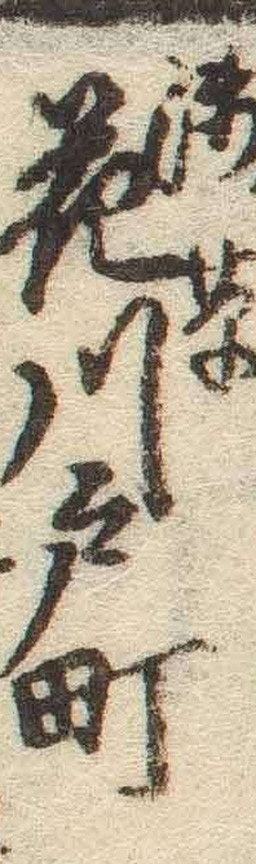花川戸町
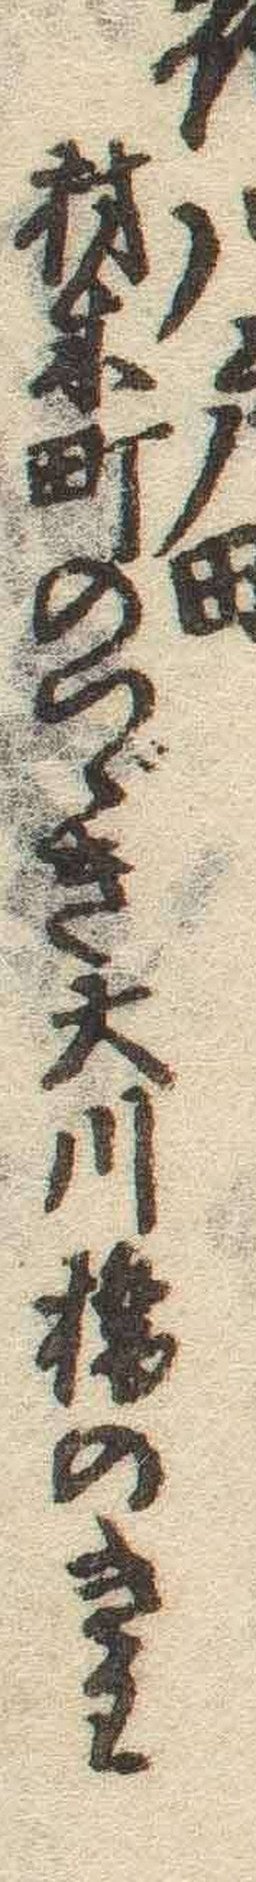材木町のつゞき大川橋のきわ

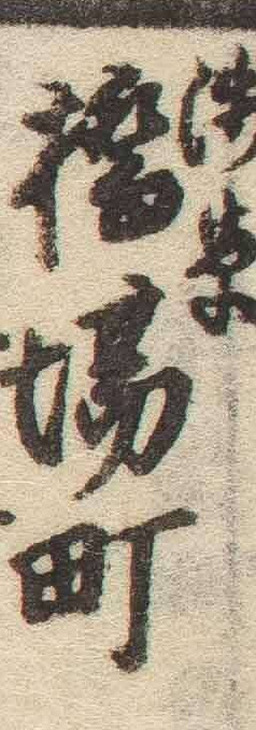橋場町
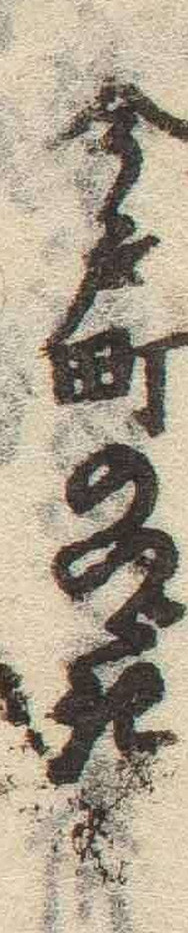今戸町のつゞき
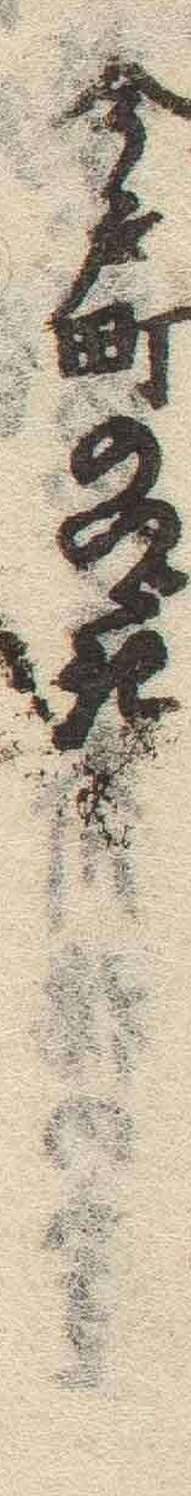今戸町のつゞき
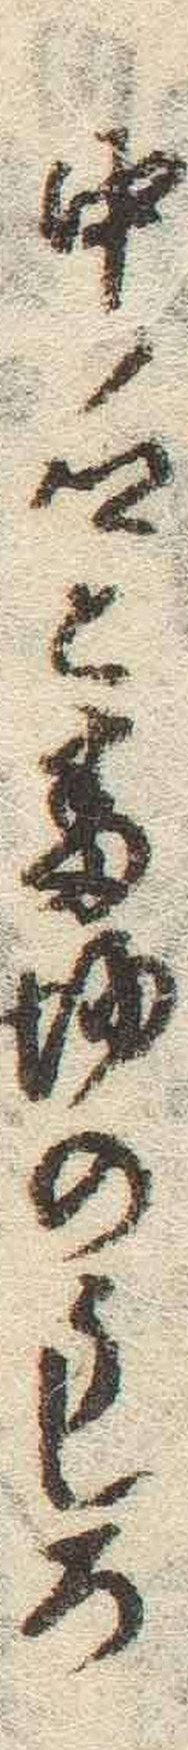中ノ郷と番場のうしろ
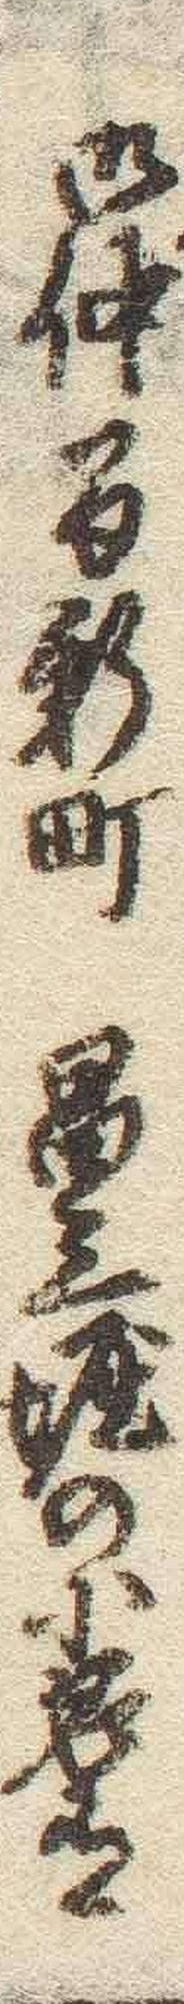御仲間新町昌三堀の小名有
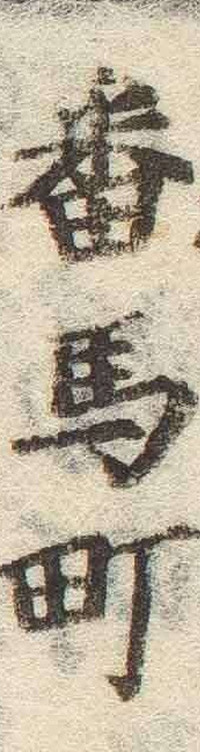番馬町
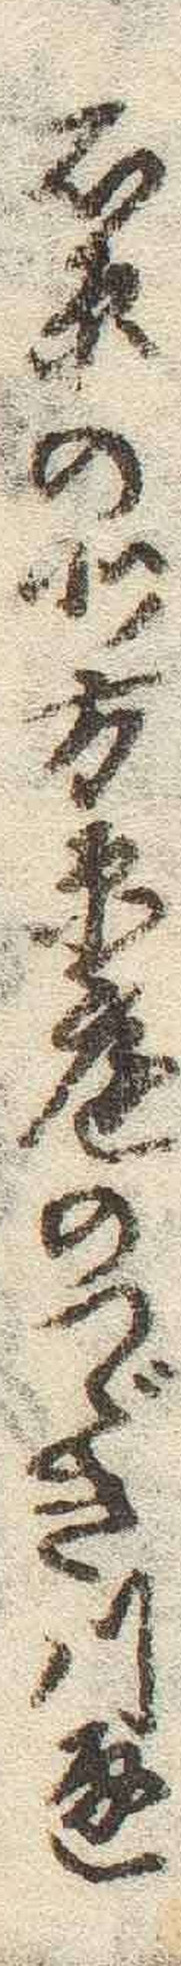石原の北ノ方原庭のつゞき川通
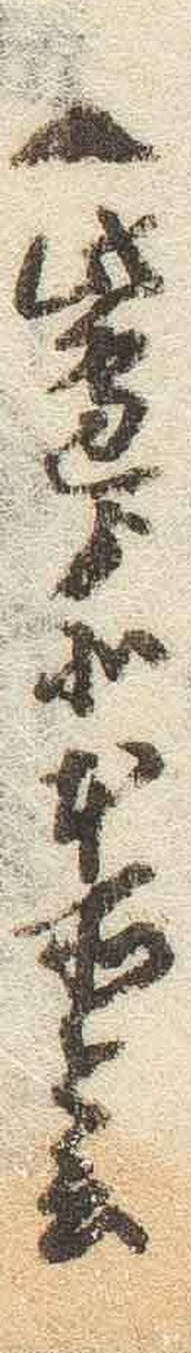▲此辺ゟ北本所と云
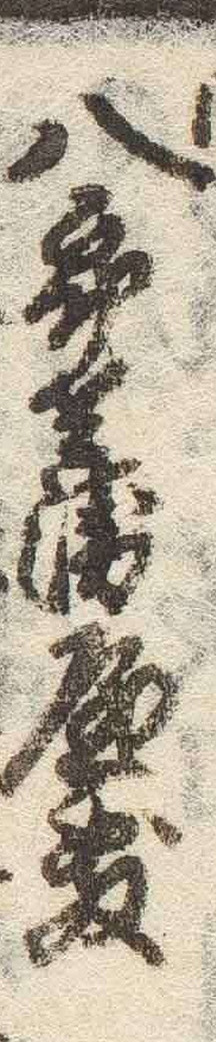八郎兵衛屋敷
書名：江戸町独案内
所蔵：東京学芸大学附属図書館 国文学研究資料館
